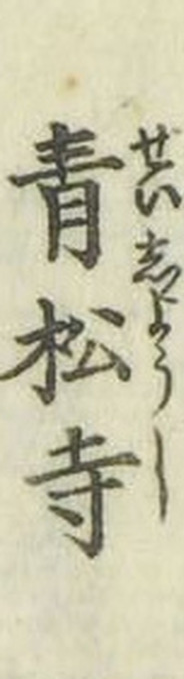青松寺
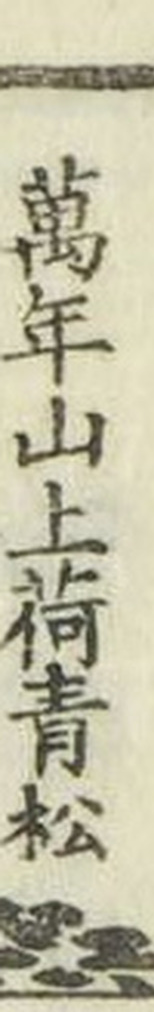萬年山上荷青松
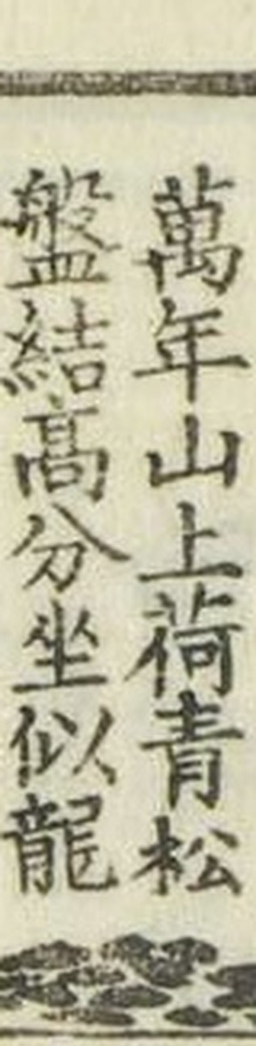盤結高分坐似龍
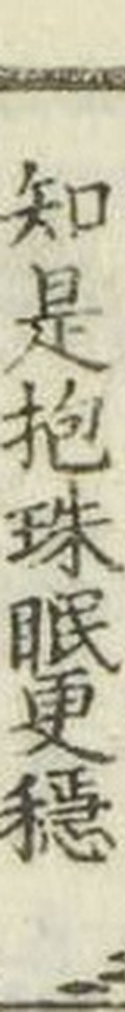知是抱珠眠更穏
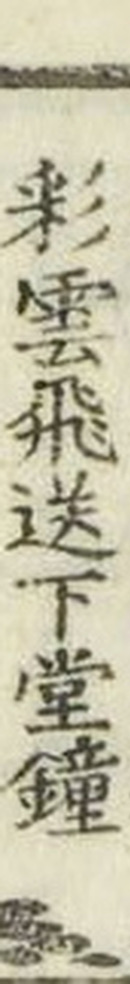彩雲飛送下堂鐘

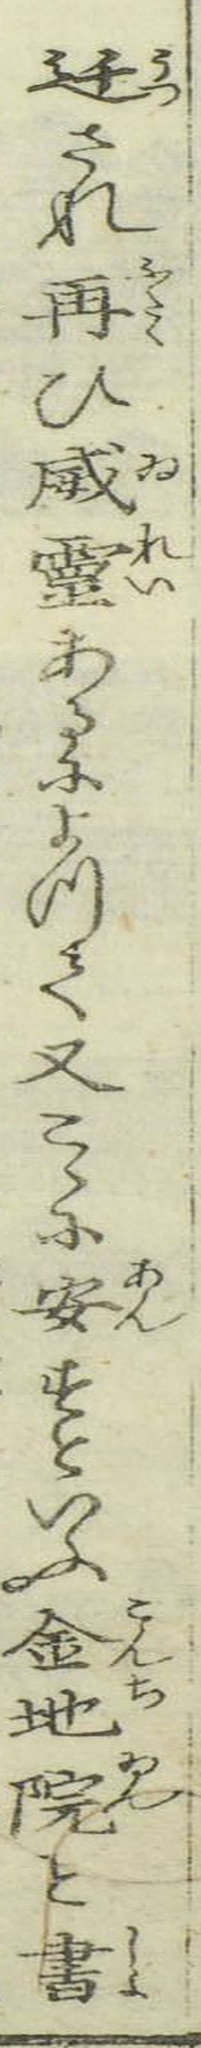遷され再ひ威霊あるによつて又こゝに安すといふ金地院と書
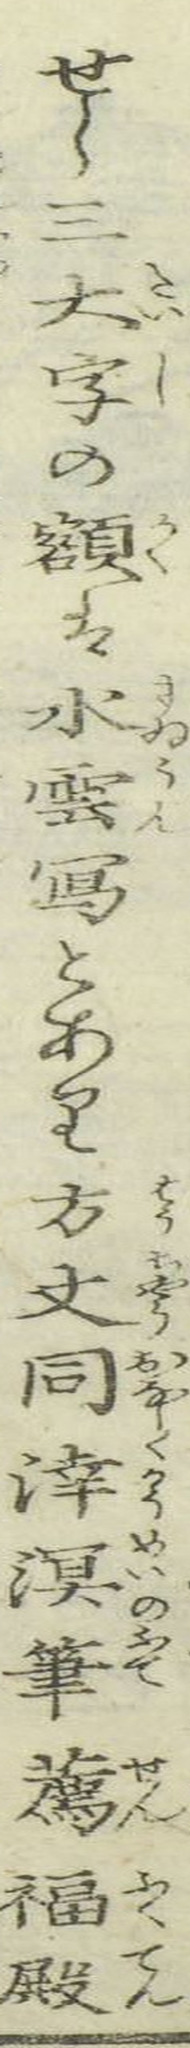せし三大字の額は水雲寫とあり方丈同涬溟筆薦福殿
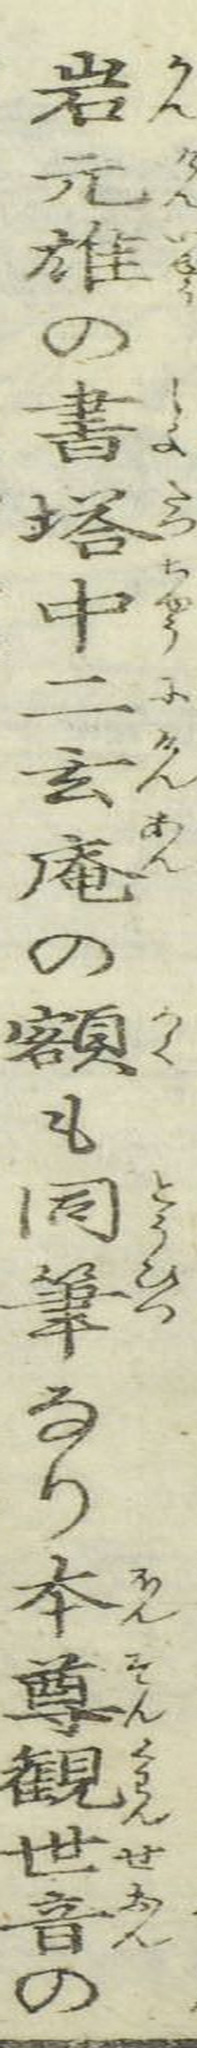岩元雄の書塔中二玄庵の額も同筆なり本尊観世音の
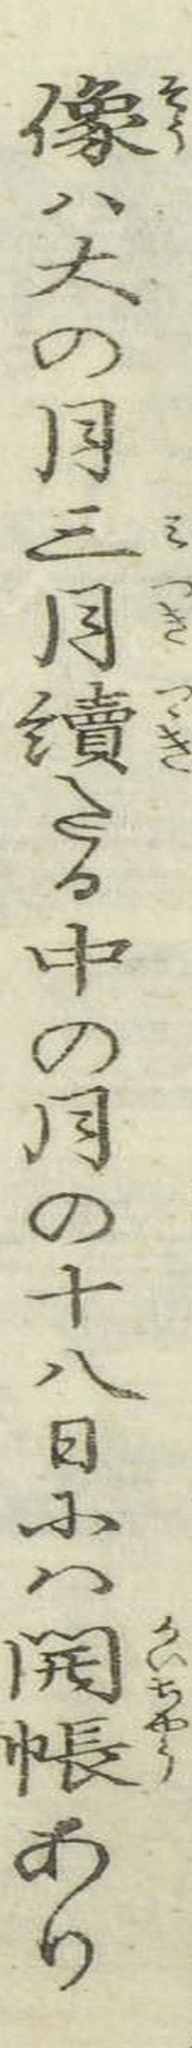像は大の月三月続たる中の月の十八日には開帳あり
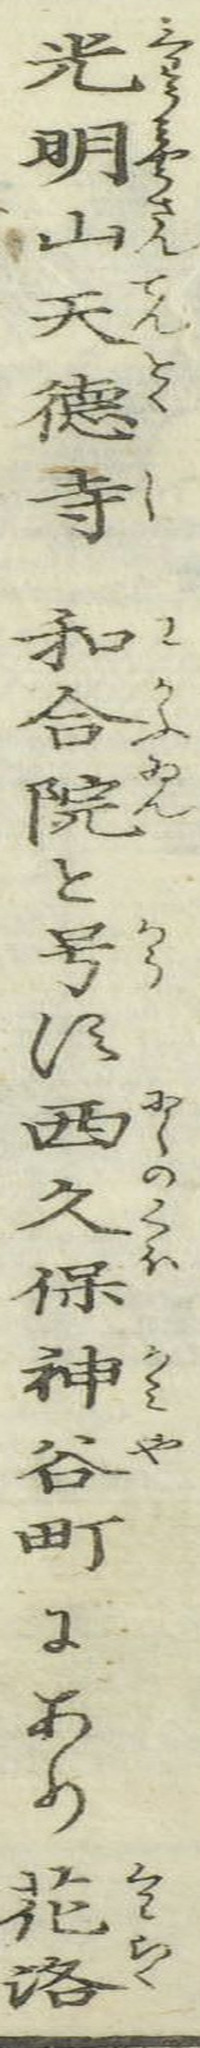光明山天徳寺和合院と号す西久保神谷町にあり花洛
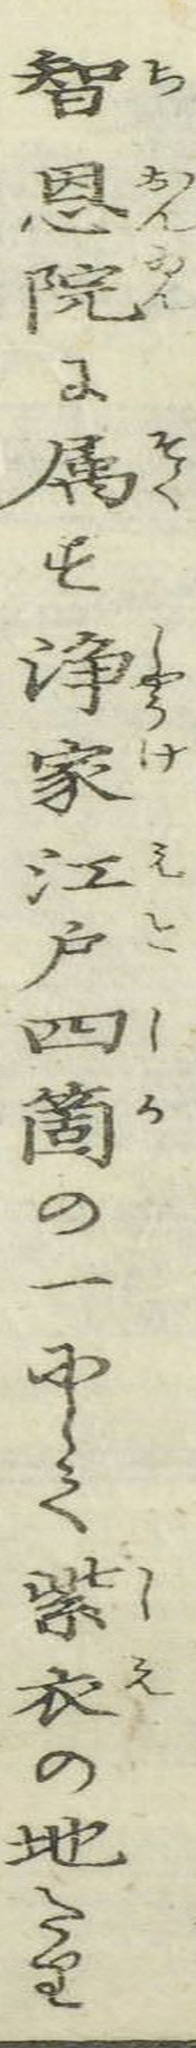智恩院に属す浄家江戸四箇の一にして紫衣の地たり
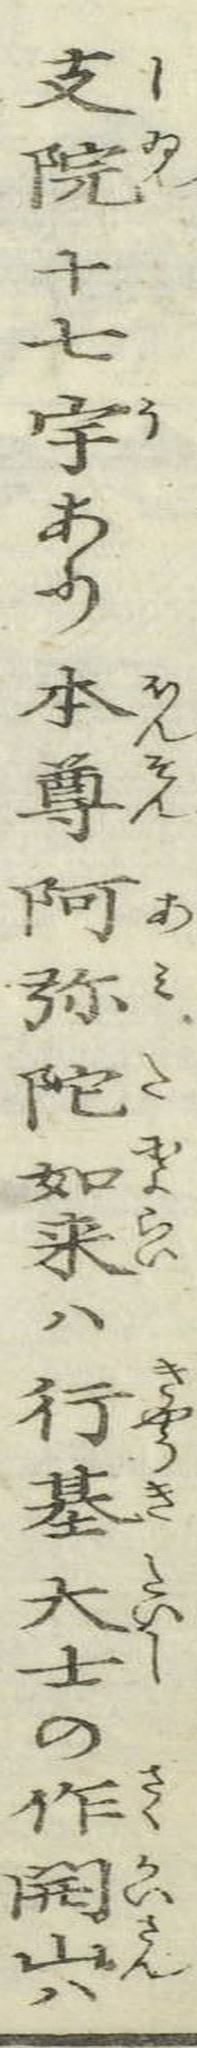支院十七宇あり本尊阿弥陀如来は行基大士の作開山は
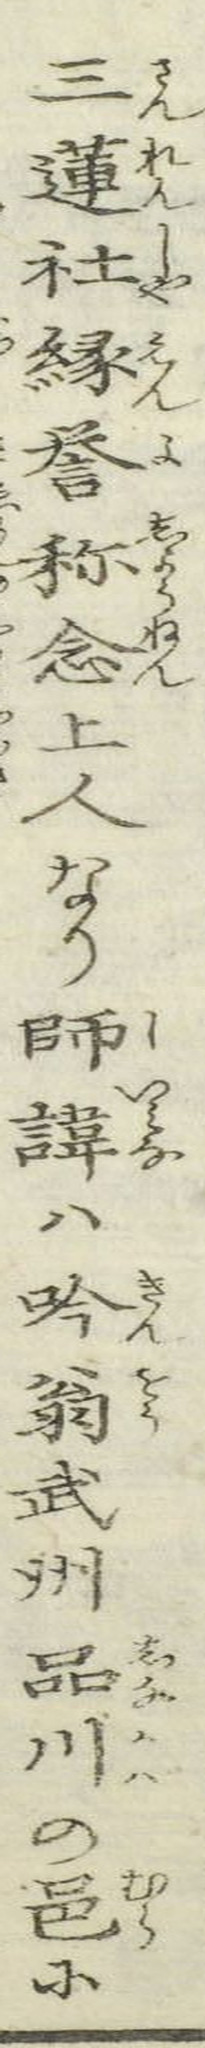三蓮社縁誉称念上人なり師諱は吟翁武州品川の邑に
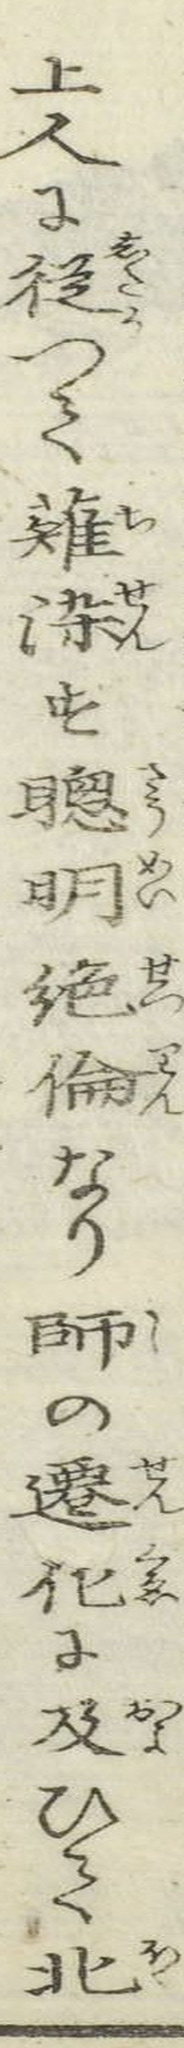上人に従つて薙染す聡明絶倫なり師の遷化に及ひて北
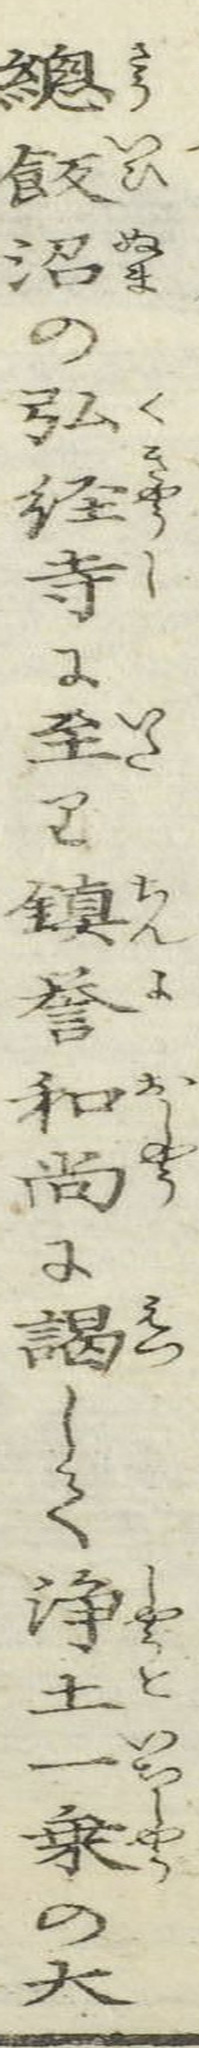総飯沼の弘経寺に至り鎮誉和尚に謁して浄土一乗の大
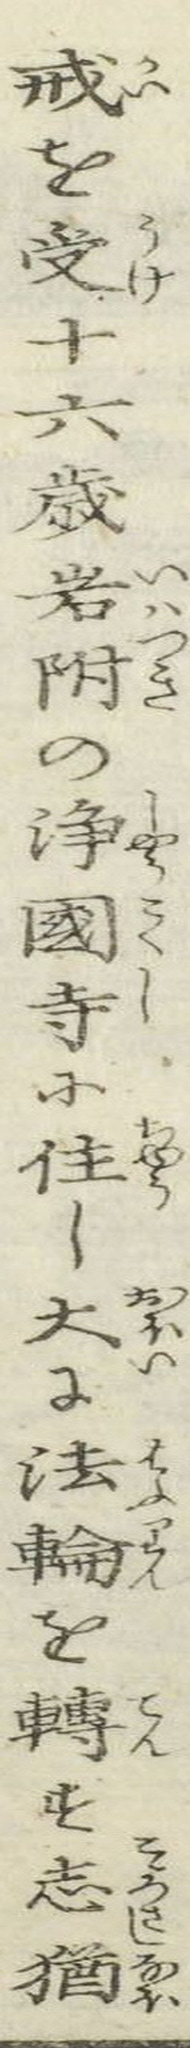戒を受十六歳岩附の浄國寺に住し大に法輪を轉す志猶
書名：江戸名所図会 20巻 巻之3
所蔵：東京学芸大学教育コンテンツアーカイブ
